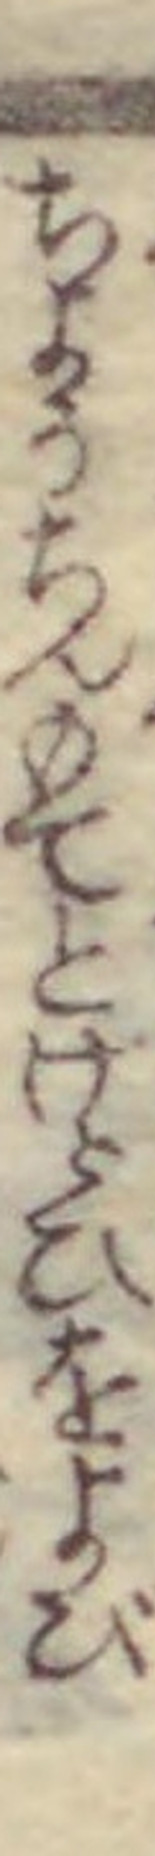ちようちんもてとけらひをよび
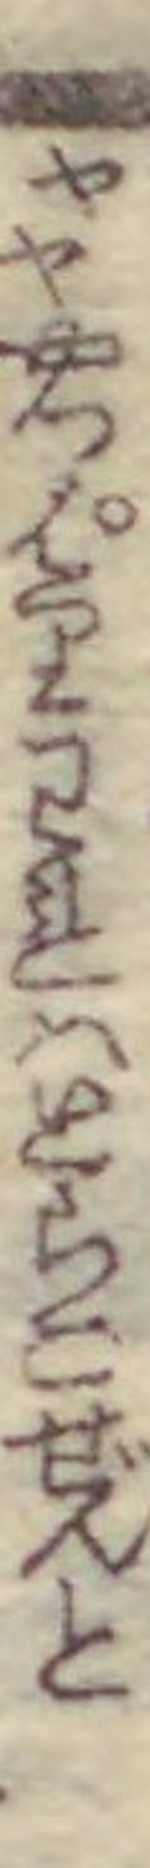ヤヤやつぱりわれはとらごぜんと
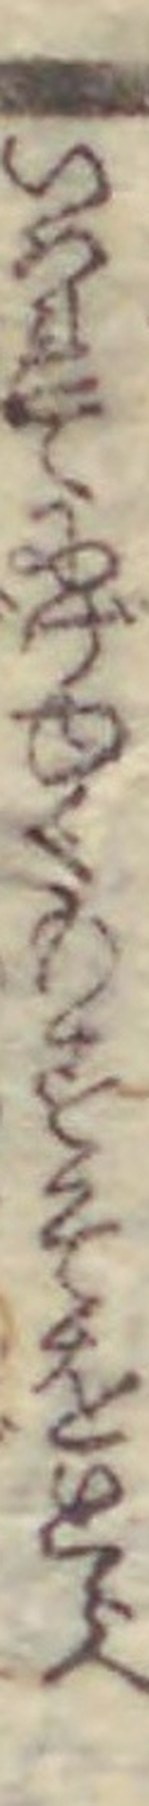いはれてにげゆくもすそをとらへ
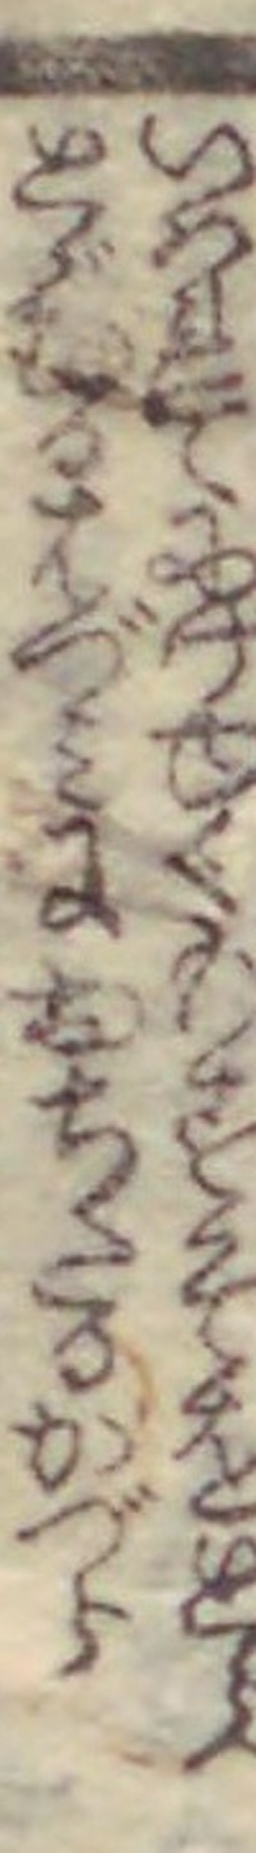とゞむるはづみにおちたるかづら
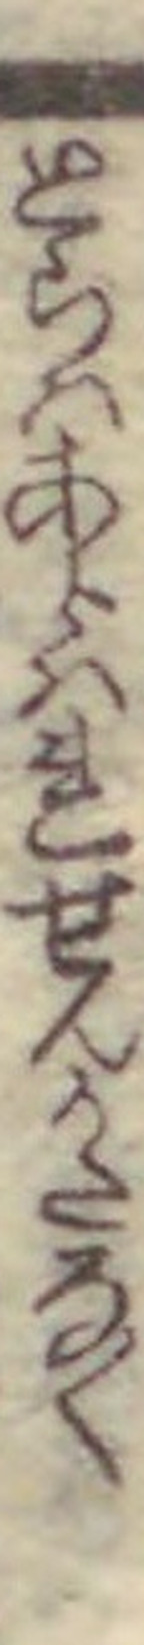とらはあらはれせんかたなく
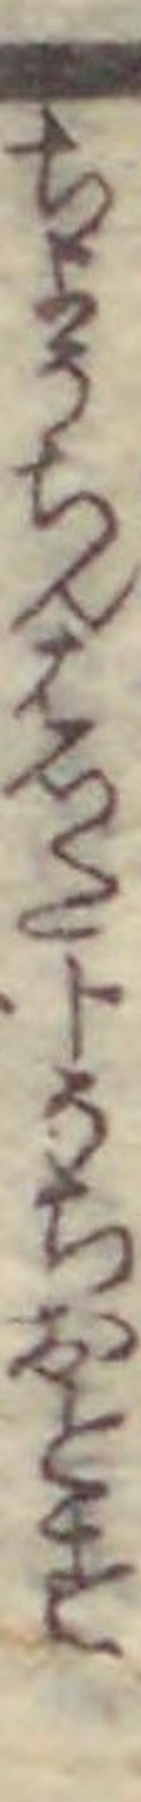ちようちんはつたとうちおとす
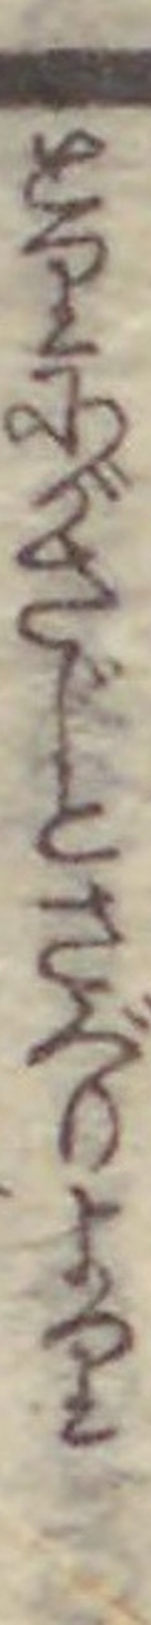とりにがさじとさぐりより
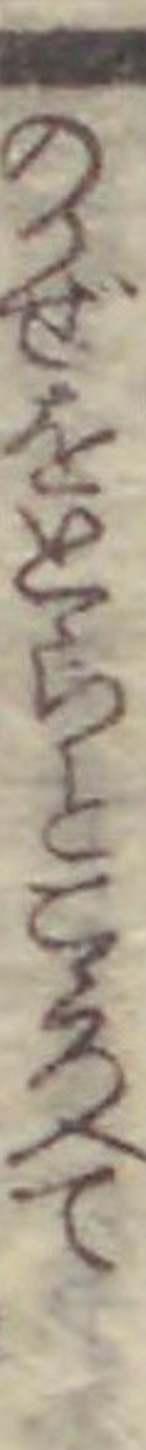のかぜをとらとこゝろへて
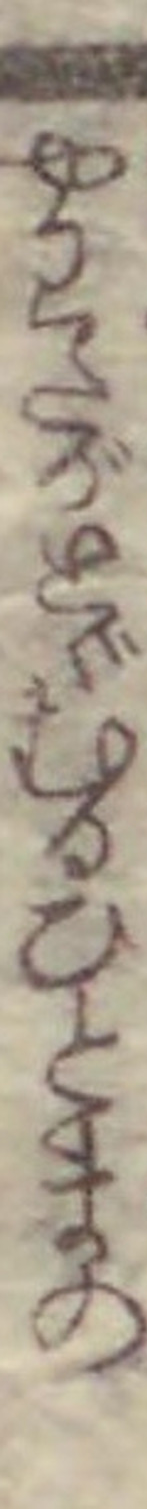やわたがとゞむるひとまの
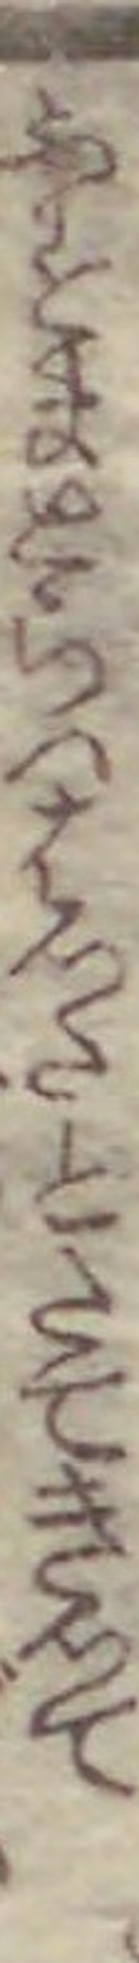ふすまとらははつたとたてきつて
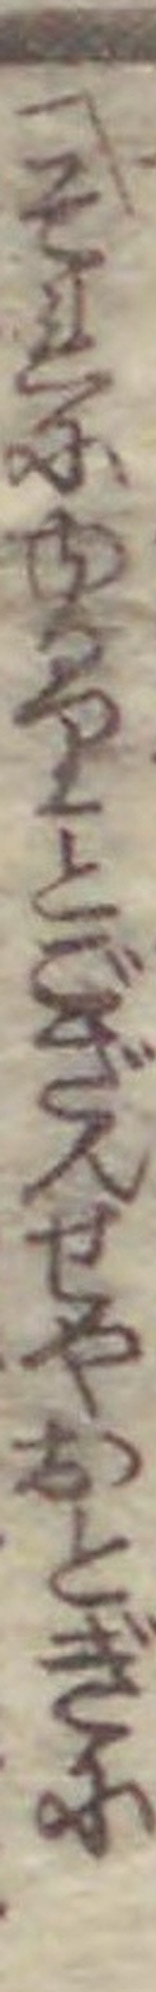〽それにゆるりとござんせやおとぎに
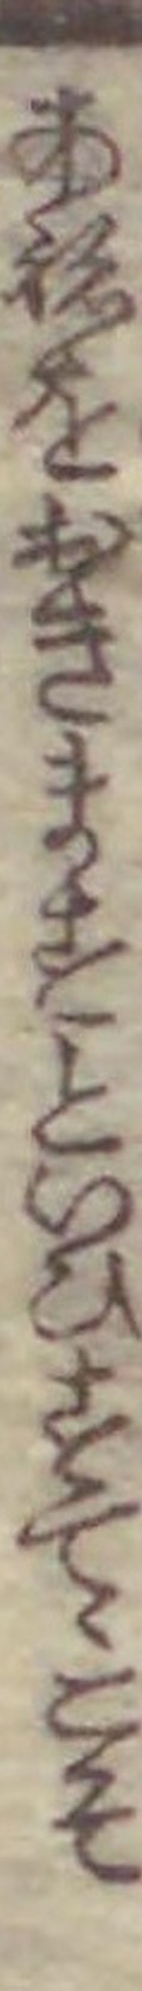あねをおきますといひすてゝこそ
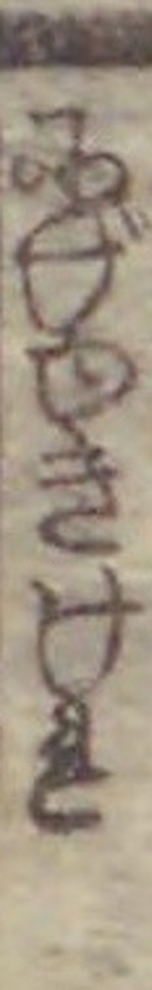にげゆきけり

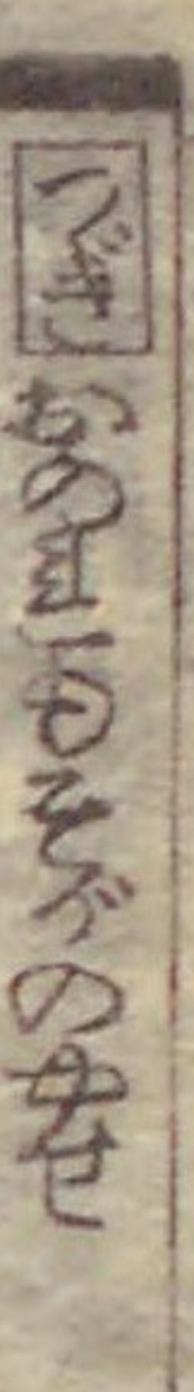つゞきおのれもそがのやせ
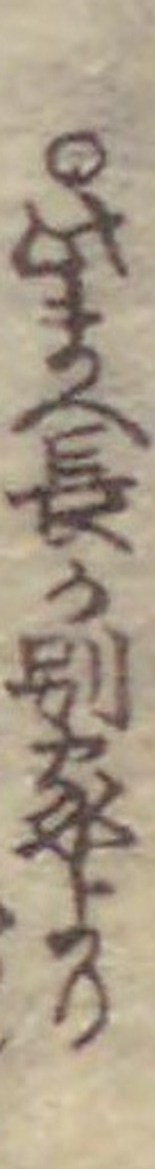○此まへ長か別家より
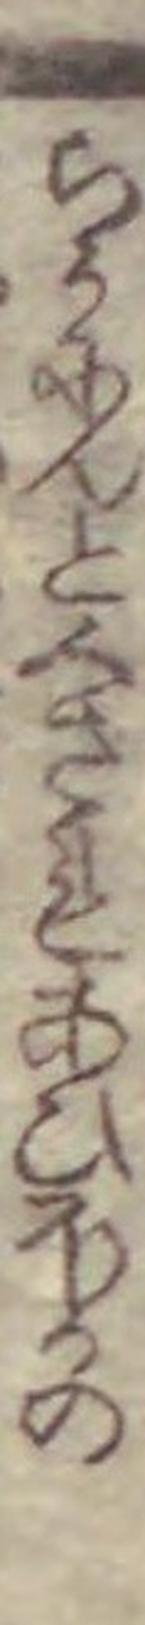らうにんとくされあひほかの
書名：大時代唐土化物 3巻. 曽我太夫染
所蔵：国立国会図書館 National Diet Library, JAPAN
